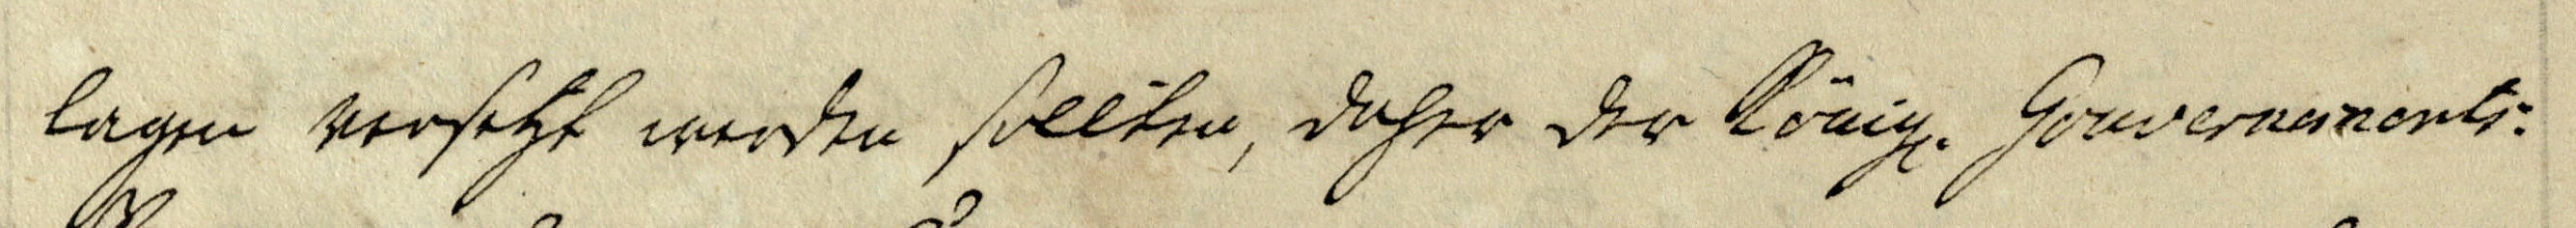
lagen versetzt werden sollten, daher der König. Gouvernements-
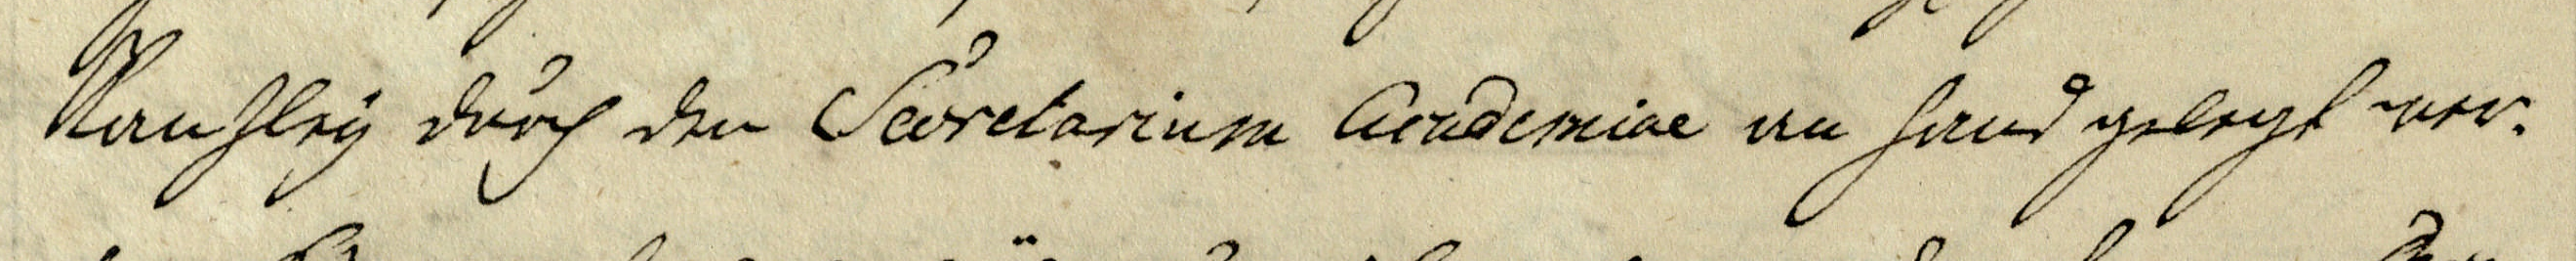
Kanzleÿ durch den Secretarium Academiae an Hand gelegt wer¬
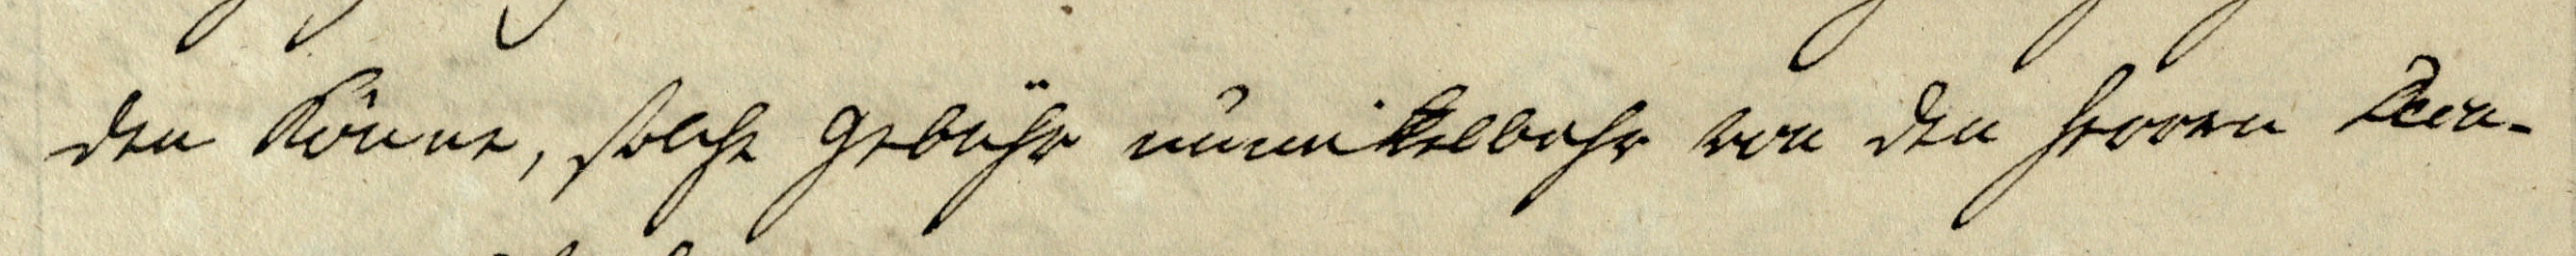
den könne, solche Gebühr unmittelbahr von den Herren Decan¬
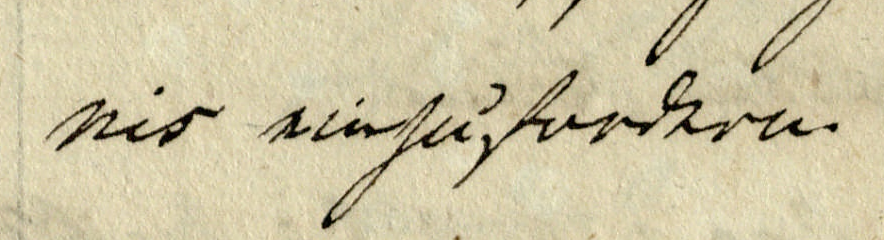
nis einzufordern.
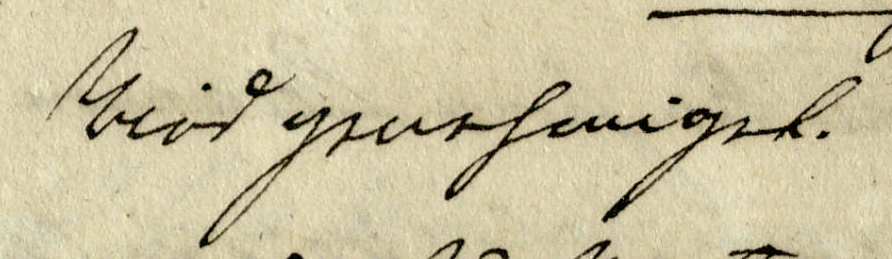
Wird genehmiget.
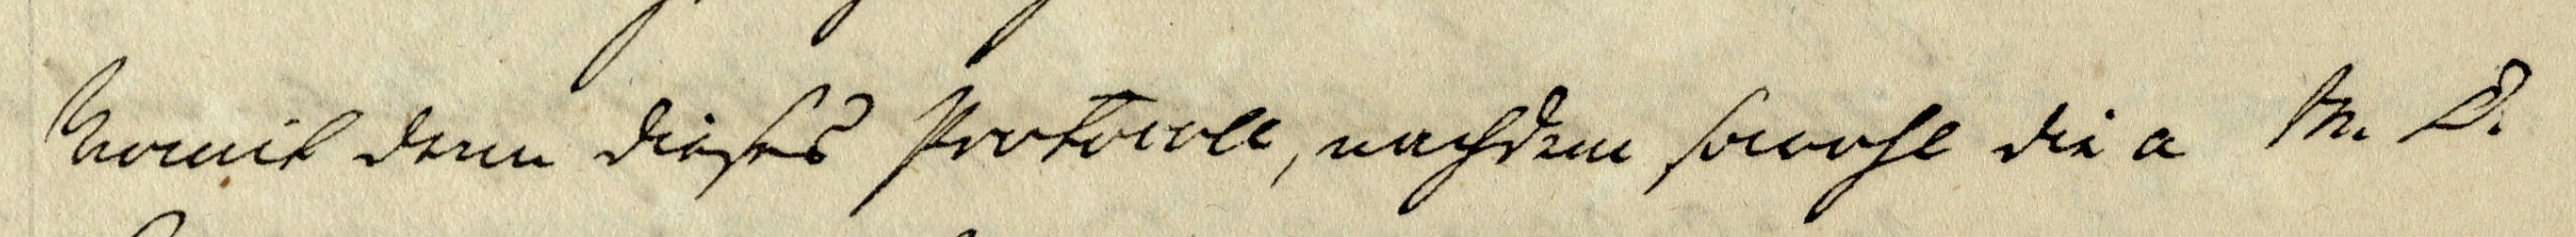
Womit denn dieses Protocoll, nachdem sowohl die a M. D.
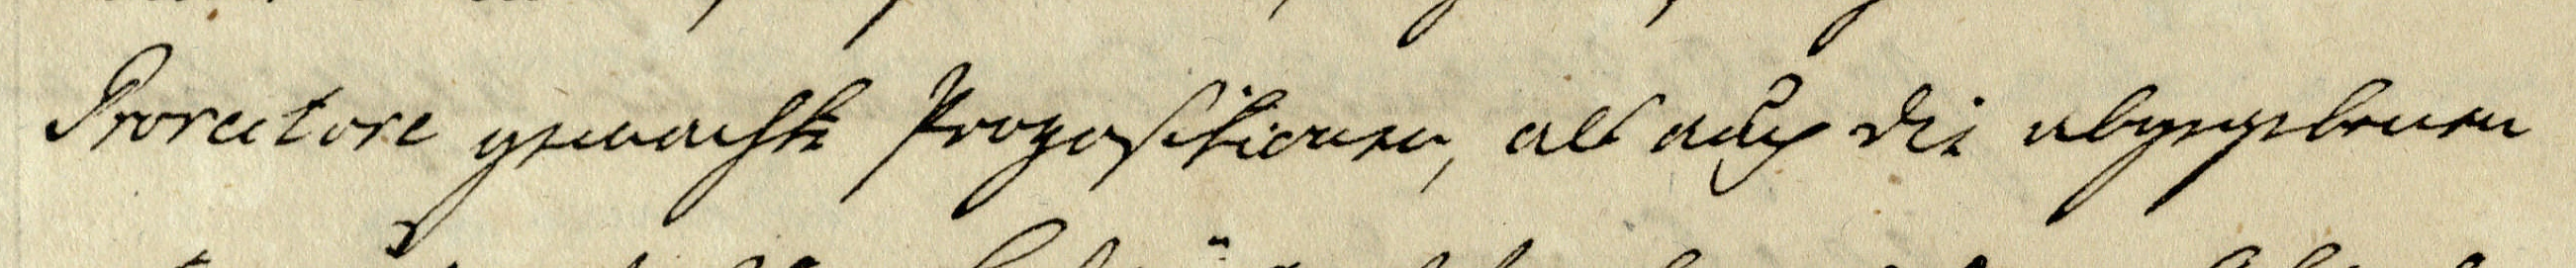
Prorectore gemachte Propositionen, als auch die abgegebenen
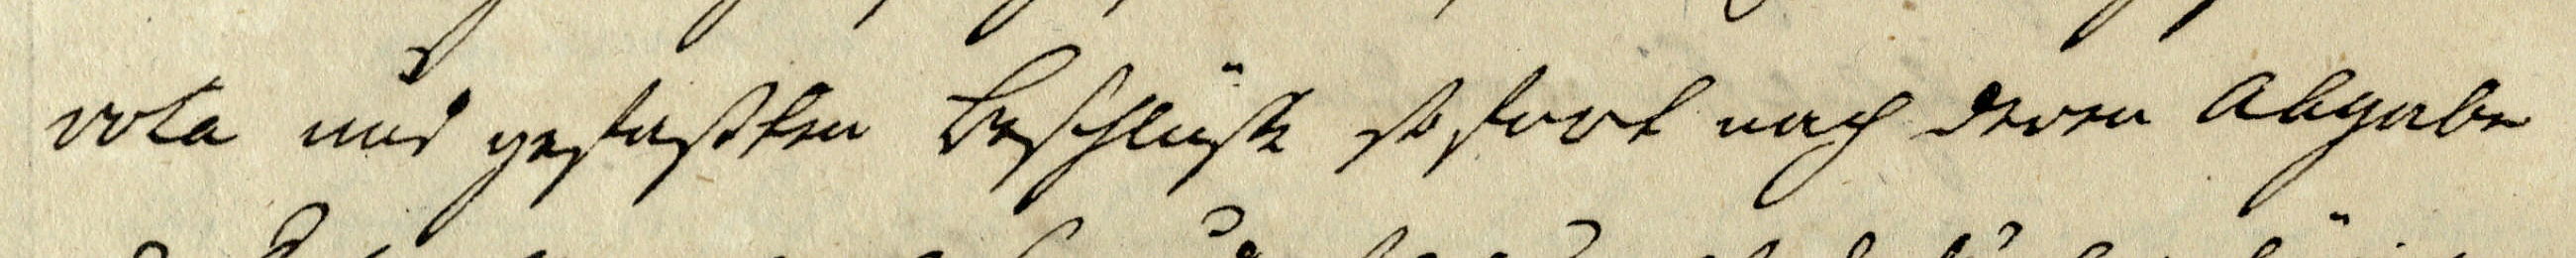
vota und gefaßten Beschlüsse sofort nach deren Abgabe
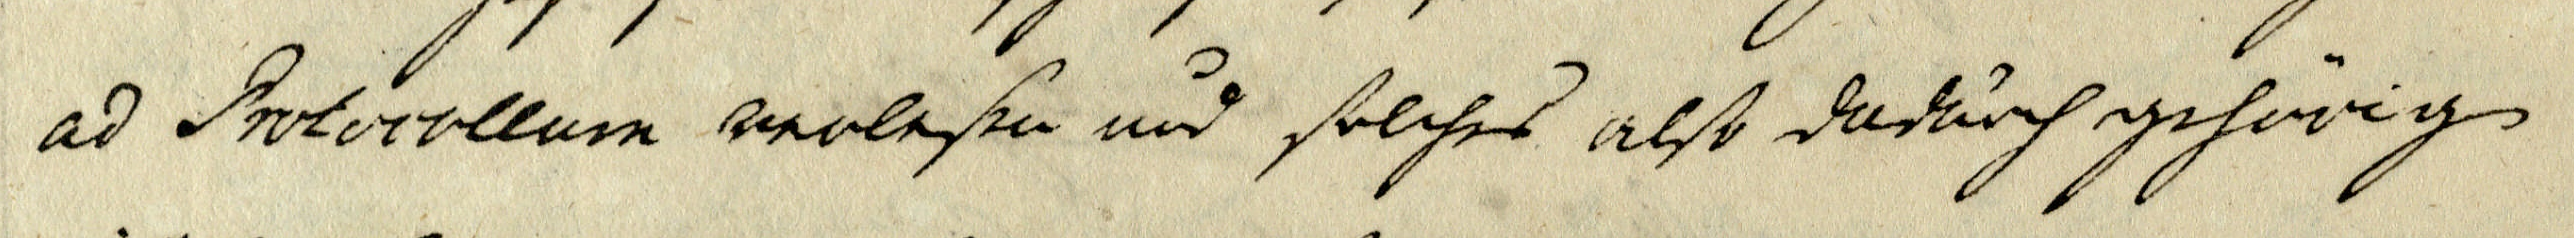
ad Protocollum verlesen und solches also dadurch gehörig
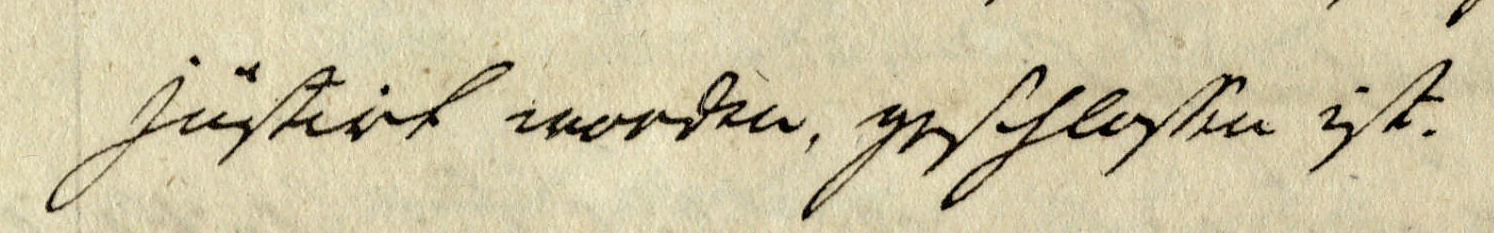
justirt worden, geschlossen ist.
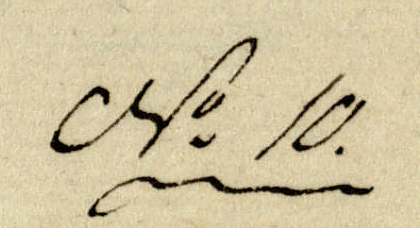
No 10.
